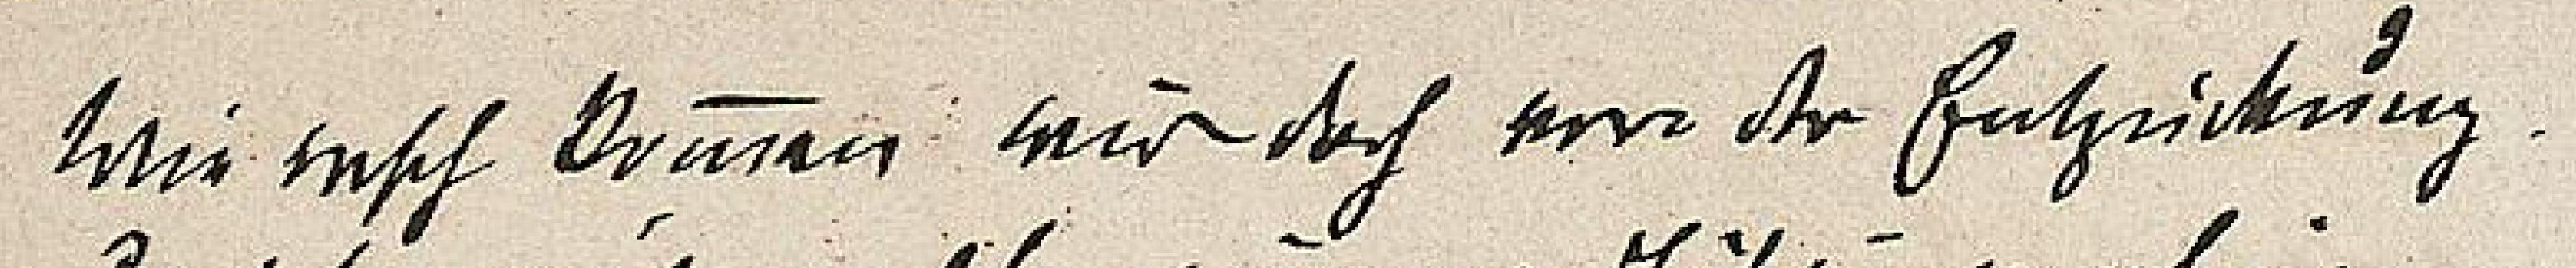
Wie rasch kommen wir doch von der Entzünkung
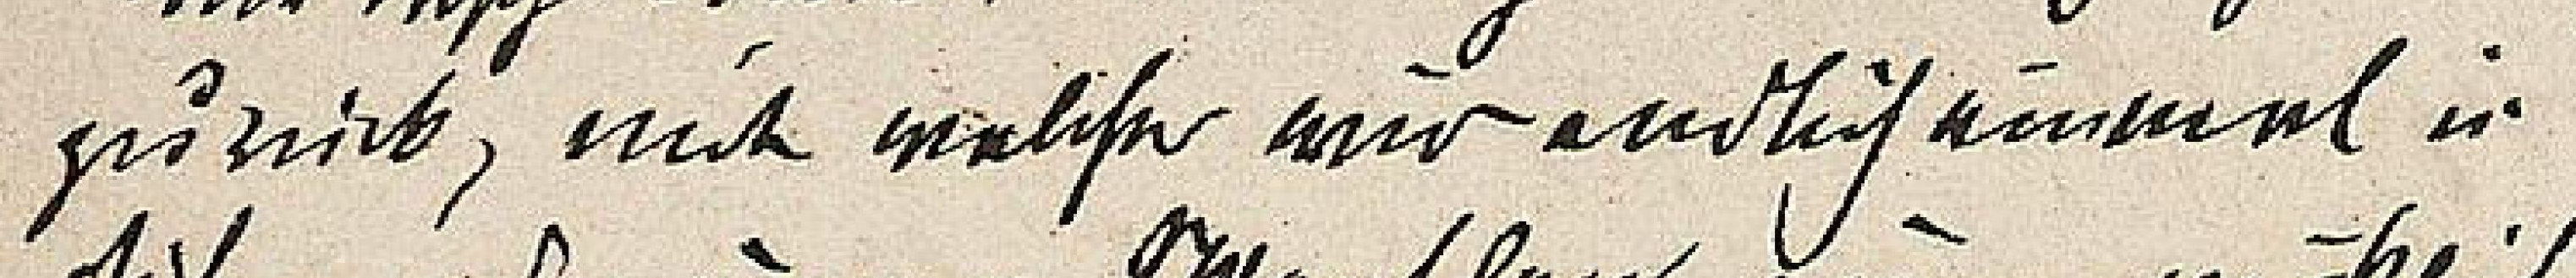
zurück, mit welcher wir endlich einmal in
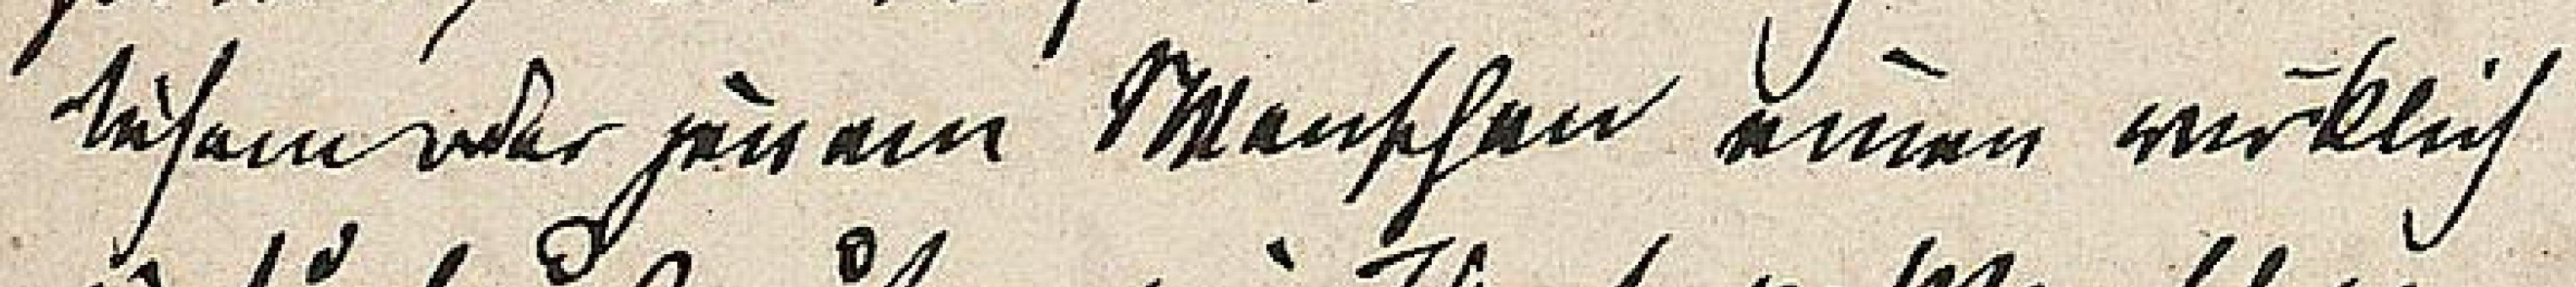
diesem oder jenem Menschen einen wirklich
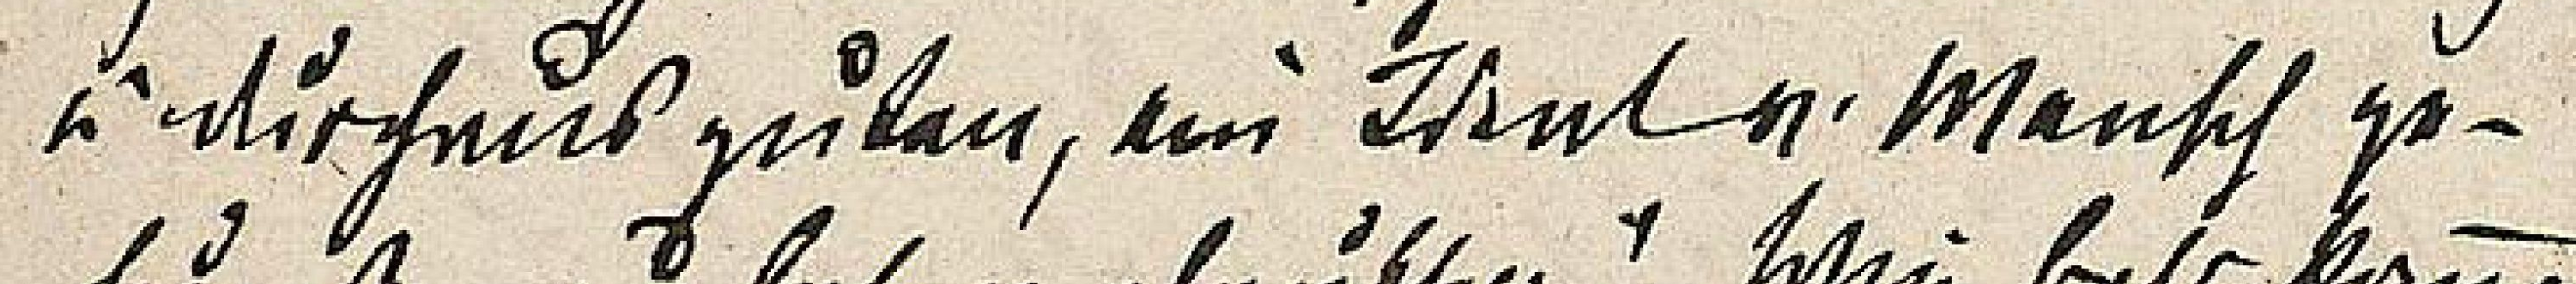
u. durchaus guten, ein Ideal v. Mensch ge¬
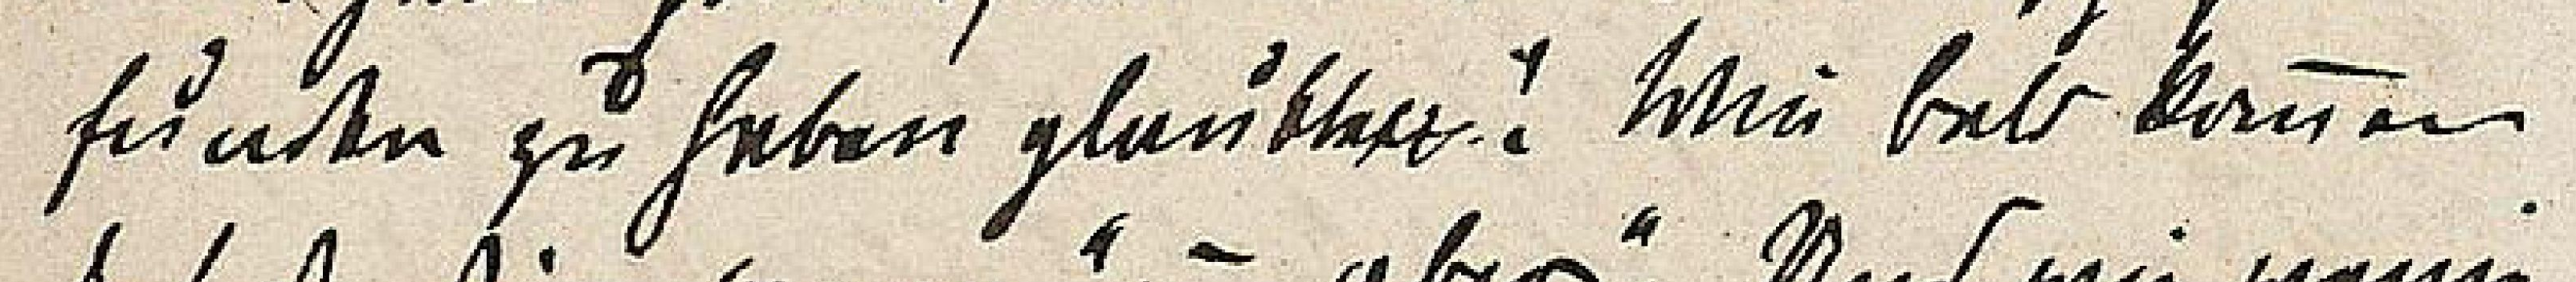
funden zu haben glaubten! Wie bald komen
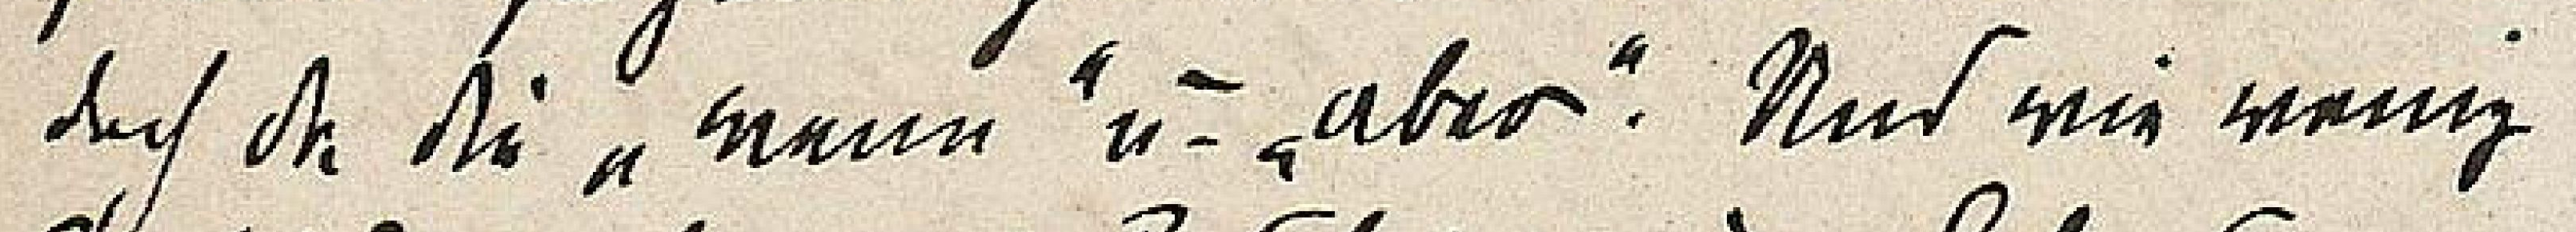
doch da die "wenn" u. "aber". Und wie wenig
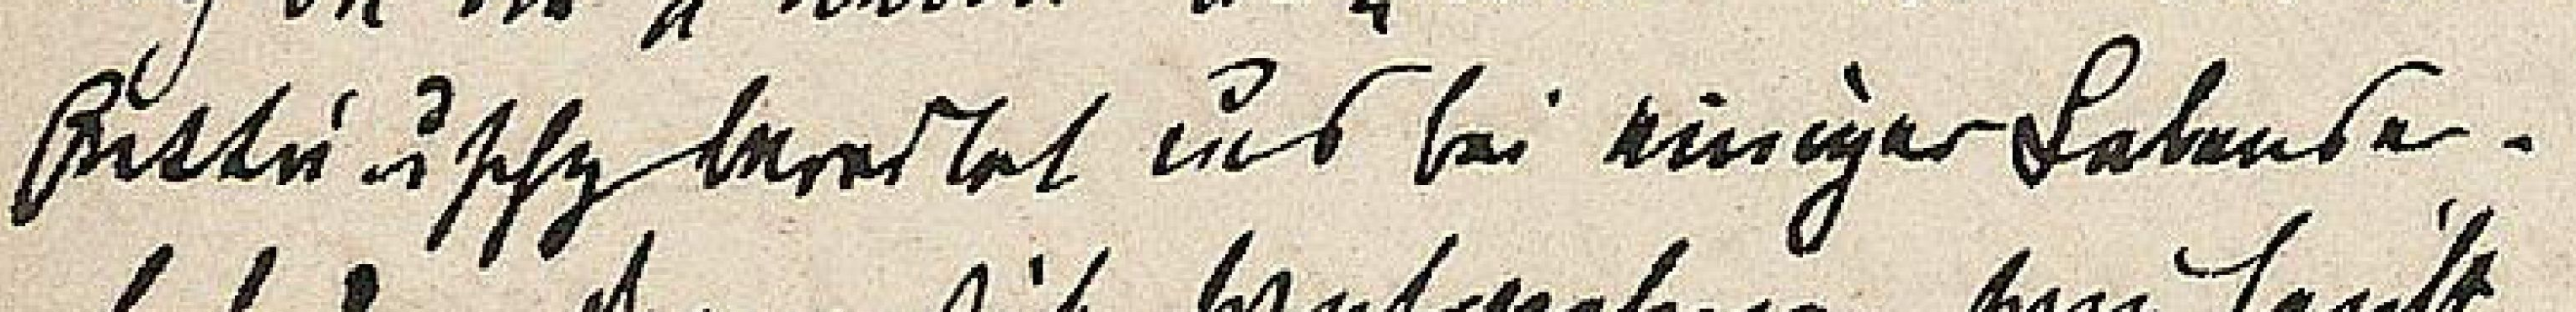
Enttäuschg bereitet uns bei einiger Lebenser¬
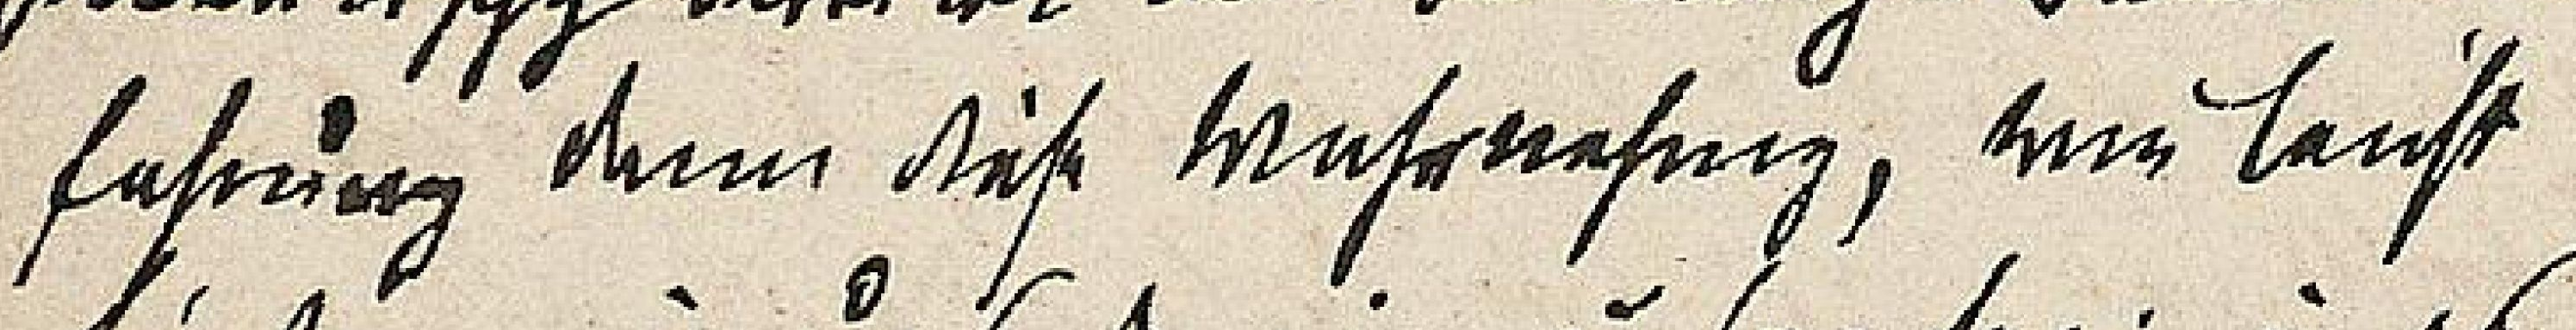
fahrung dann diese Wahrnehmng, wie leicht
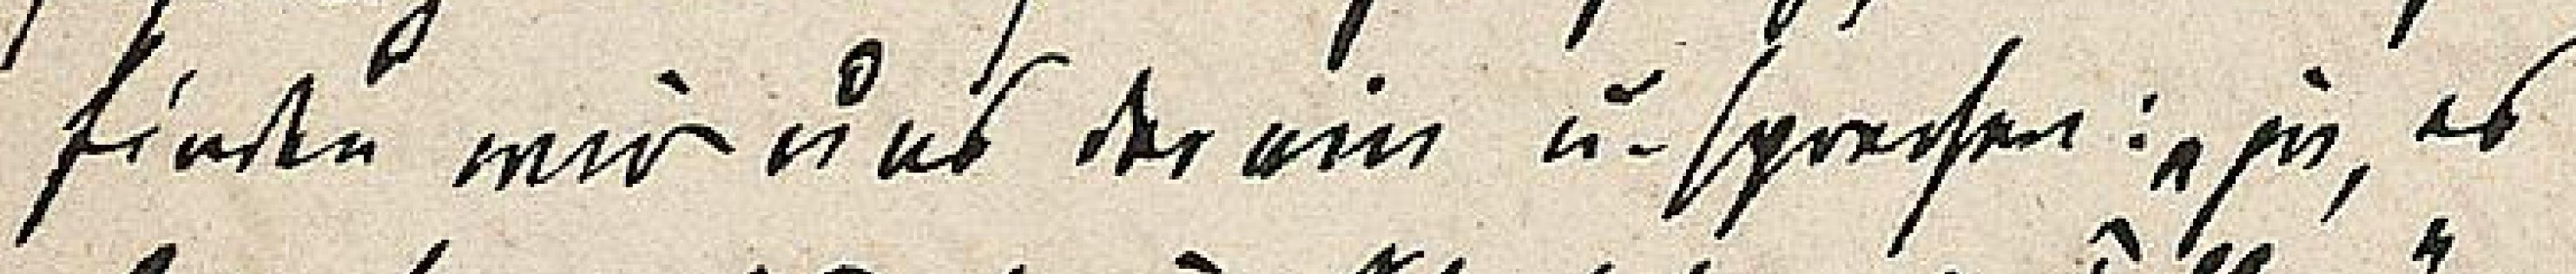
finden wir uns da ein u sprechen: "ja, es
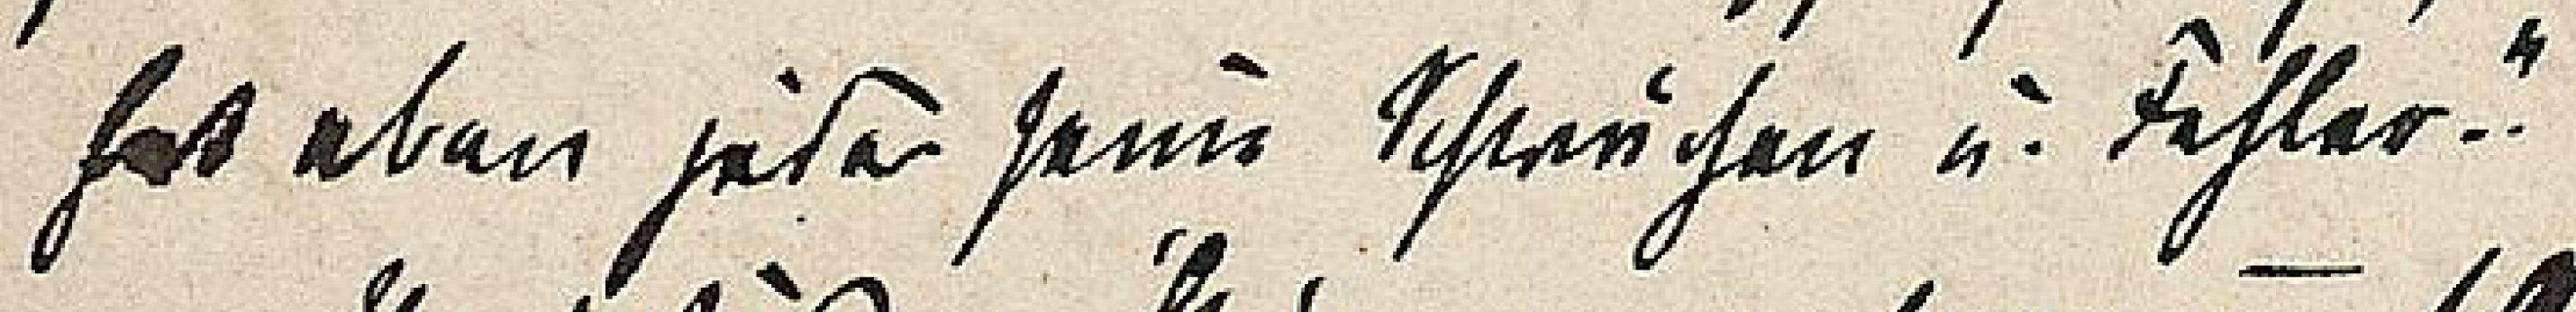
hat eben jeder seine Schwächen u. Fehler!"
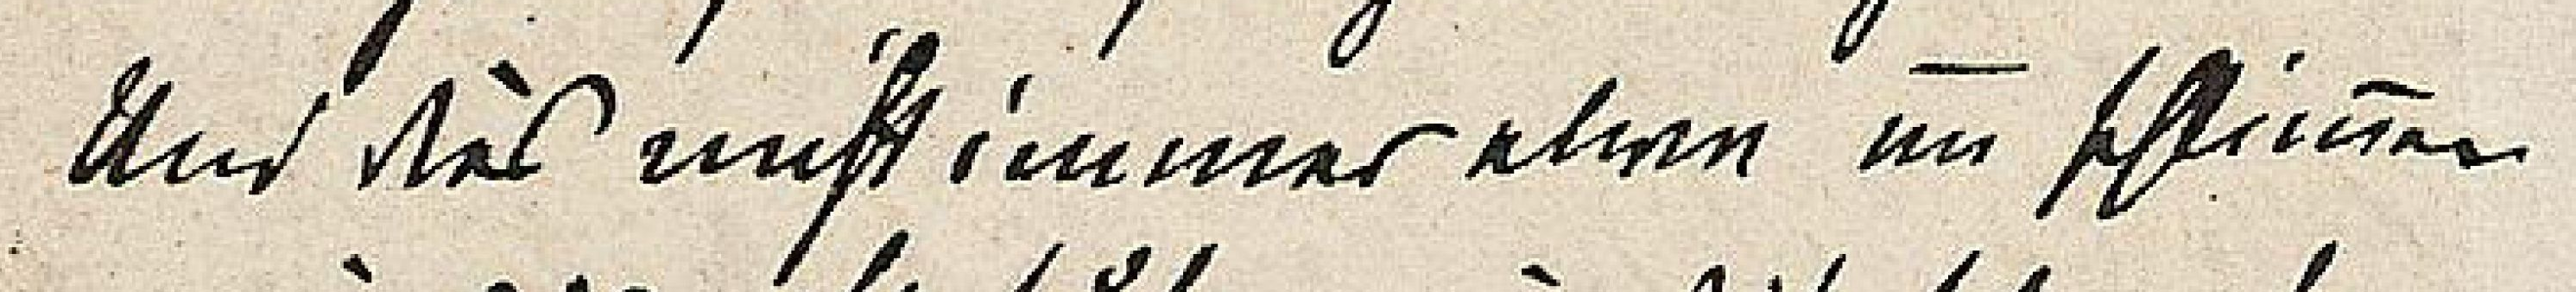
Und dies nicht immer etwa um schlimen
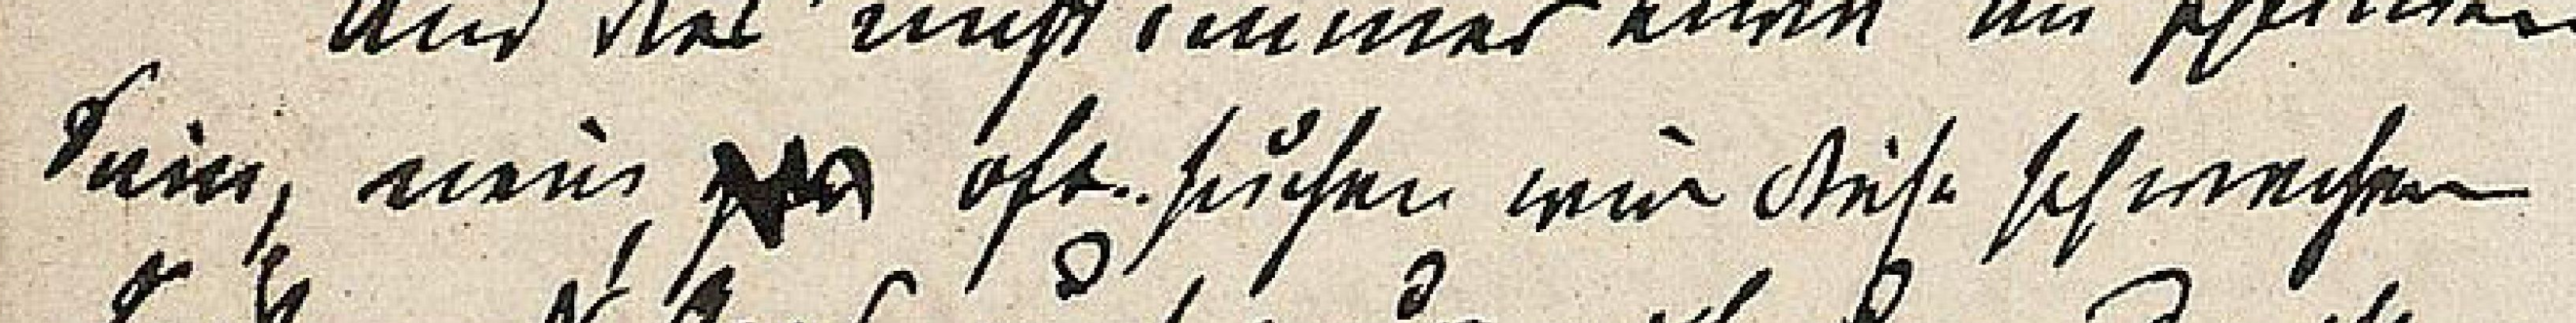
Sein, nein, gar oft. suchen wir diese schwachen
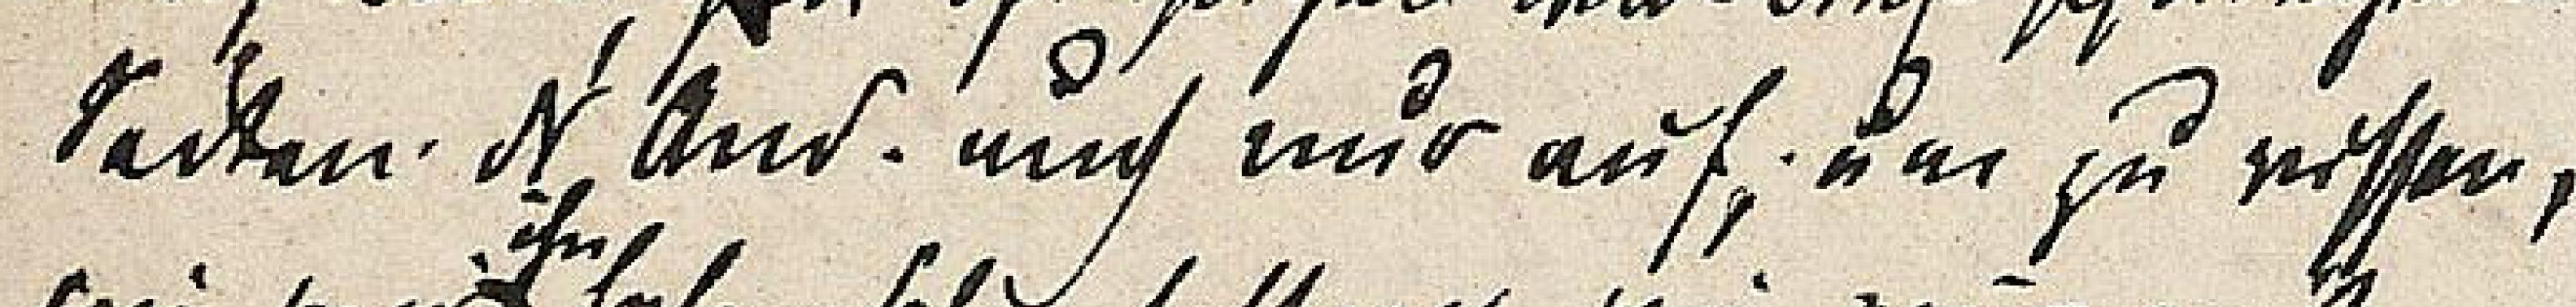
Seiten. des And. auch nur auf, um zu wissen,
